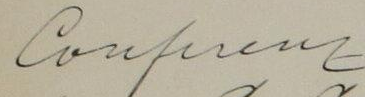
Conferenz
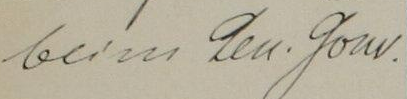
beim Gen. Gouv.
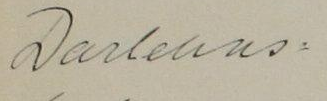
Darlehns-
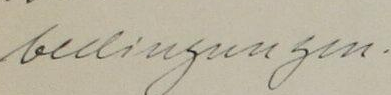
bedingungen
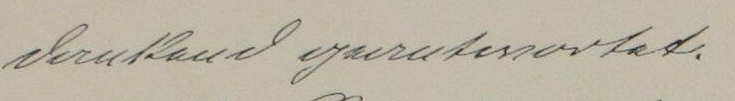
dankend geantwortet.
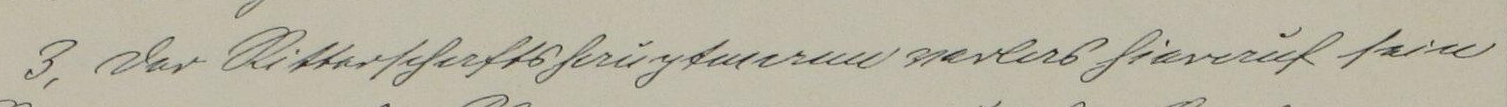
3. Der Ritterschaftshauptmann verlas hierauf sein
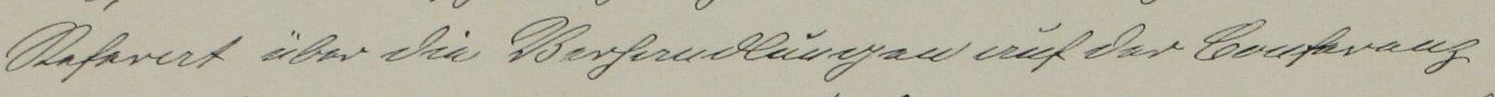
Referat über die Verhandlungen auf der Conferenz
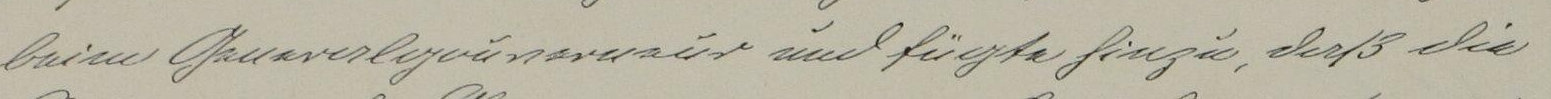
beim Generalgouverneur und fügte hinzu, daß die
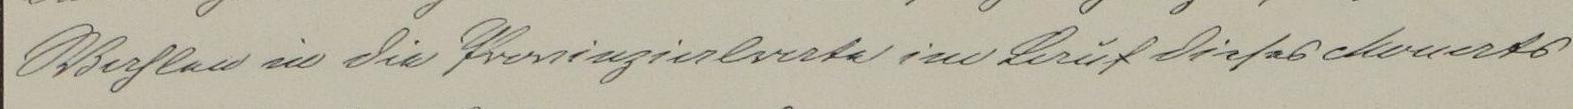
Wahlen in die Provinzialrate im Lauf dieses Monats
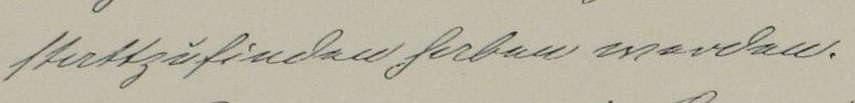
stattzufinden haben werden.
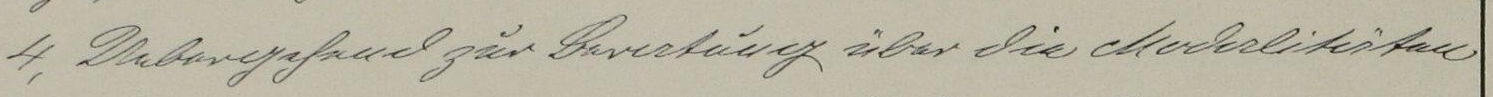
4. Uebergehend zur Beratung über die Modalitäten
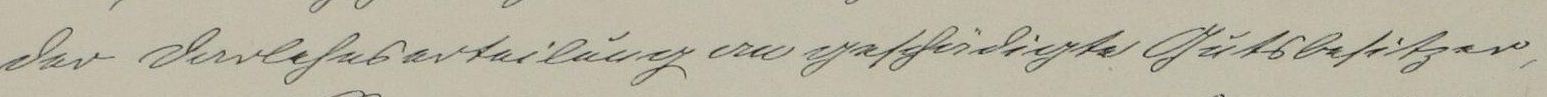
der Darlehnserteilung an geschädigte Gutsbesitzer,
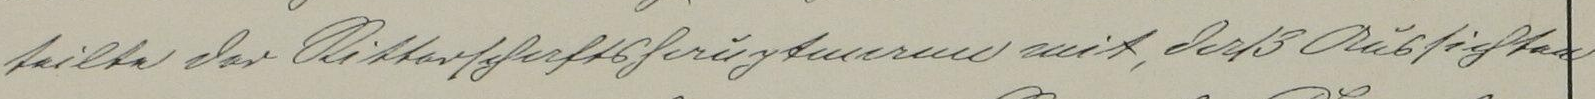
teilte der Ritterschaftshauptmann mit, daß Aussichten
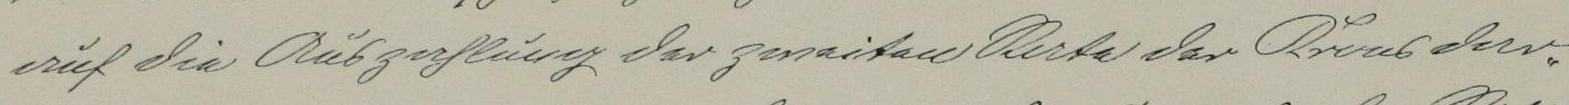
auf die Auszahlung der zweiten Rate der Kronsdar-
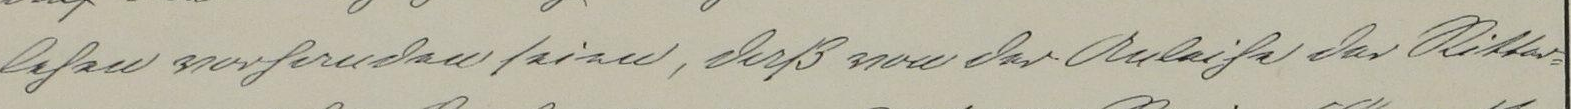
lehen vorhanden seien, daß von der Anleihe der Ritter-
